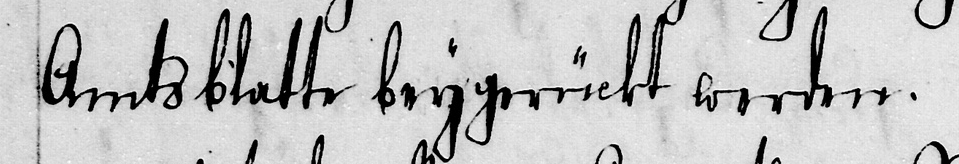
Amtsblatte beygerückt werden.
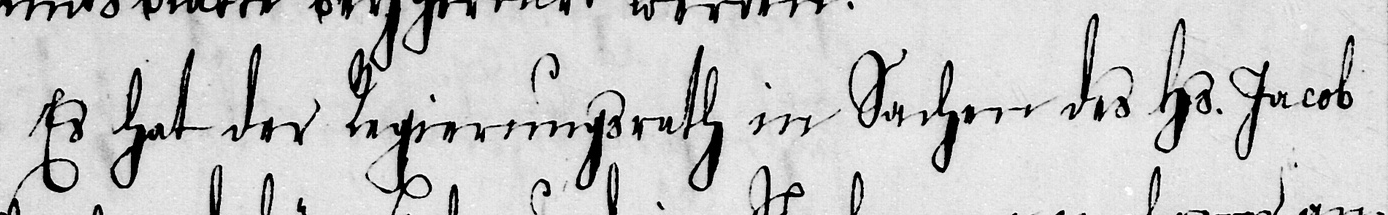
Es hat der Regierungsrath in Sachen des Hs. Jacob
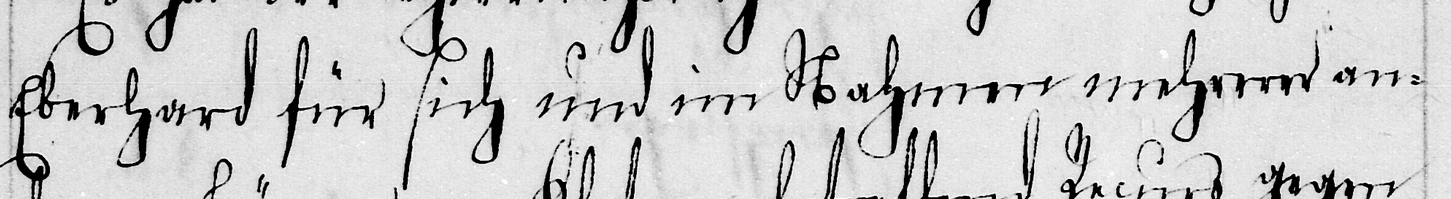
Eberhard für sich und im Nahmen mehrerer an¬
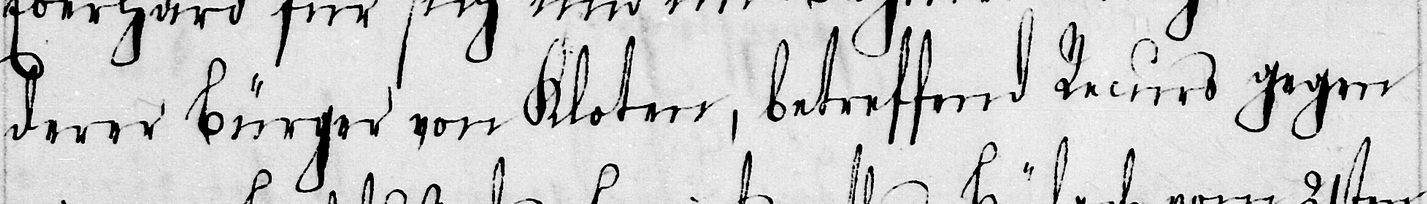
derer Bürger von Kloten, betreffend Recurs gegen
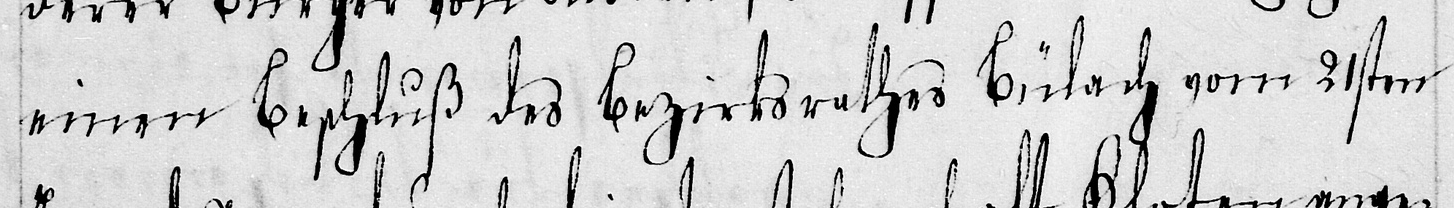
einen Beschluß des Bezirksrathes Bülach vom 21sten
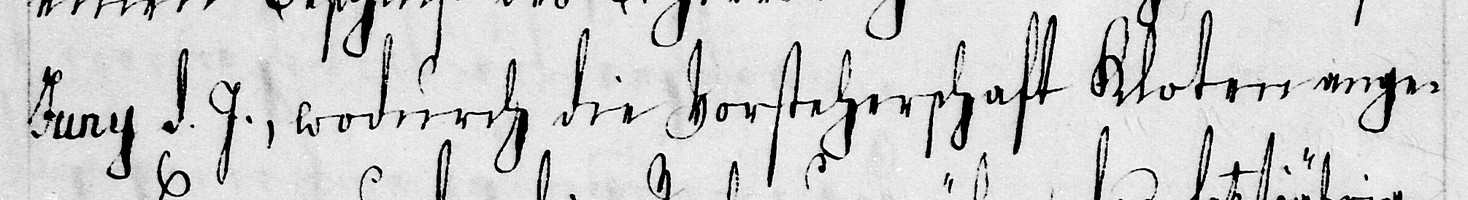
Juny d. J., wodurch die Vorsteherschaft Kloten ange¬
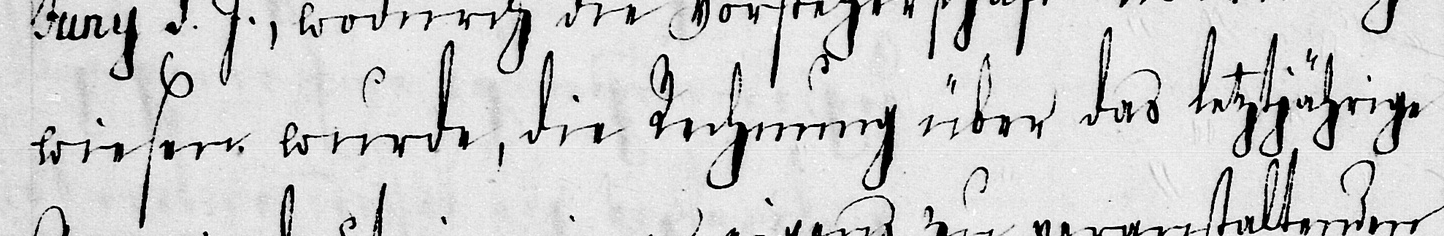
wiesen wurde, die Rechnung über das letztjährige
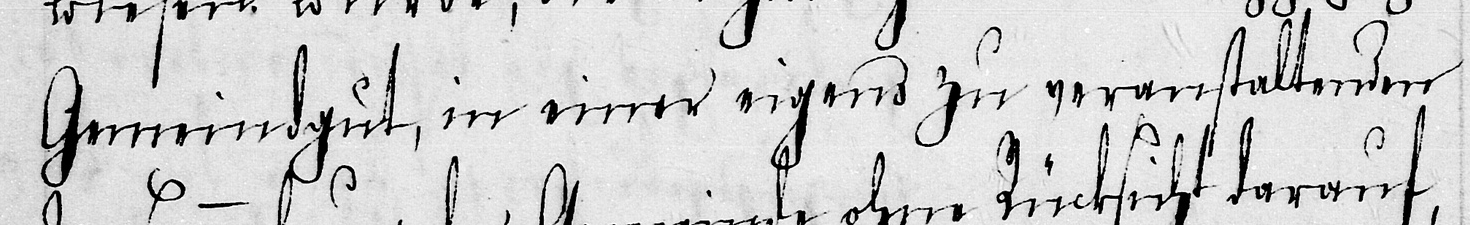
Gemeindgut, in einer eigens zu veranstaltenden
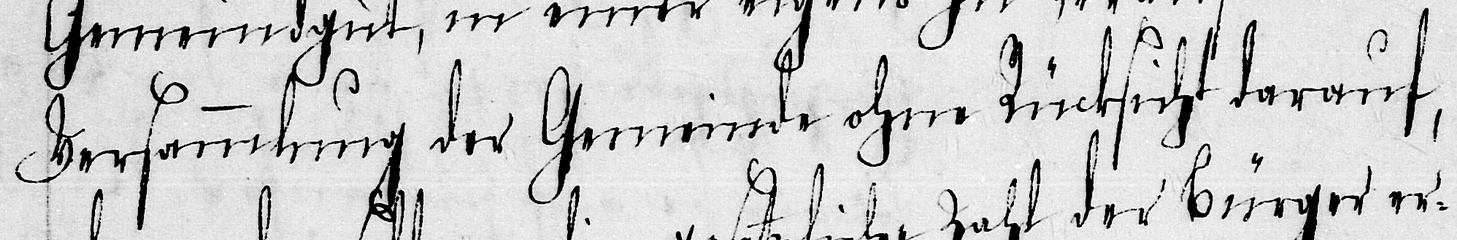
Versammlung der Gemeinde ohne Rücksicht darauf,
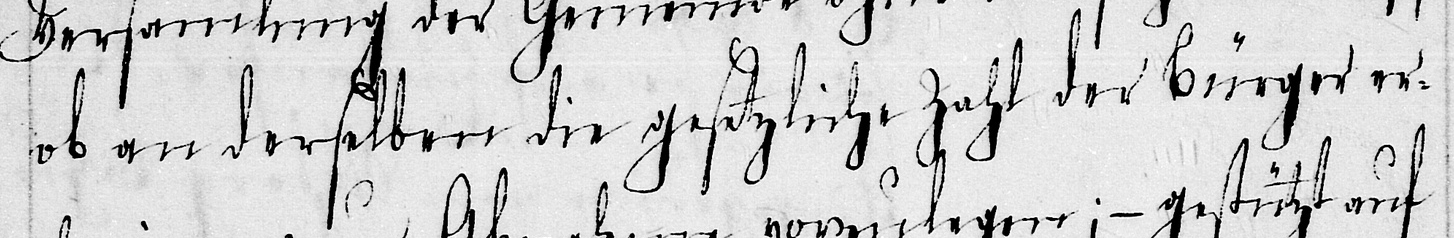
ob an derselben die gesetzliche Zahl der Bürger er¬
